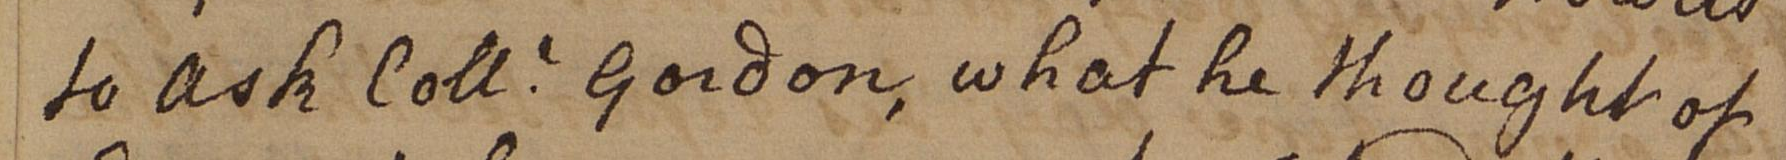to ask Coll^l. Gordon, what he thought of
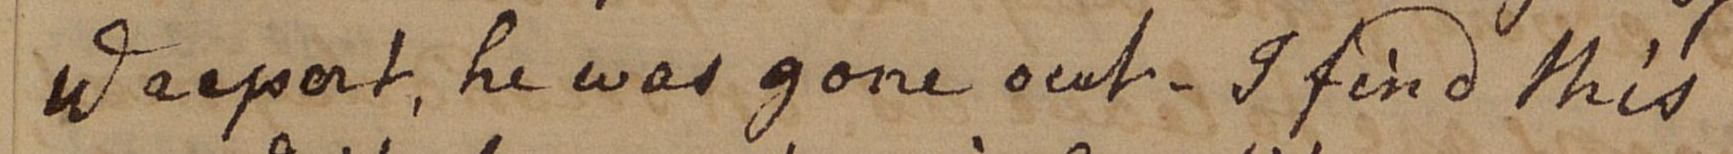y^e report, he was gone out- I find this
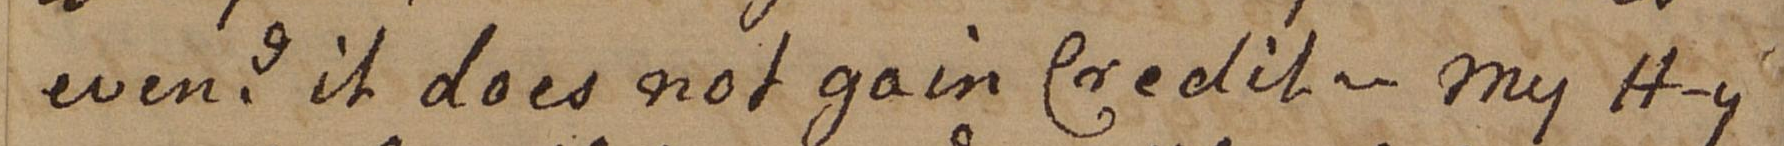even^g. it does not gain Credit- my H-y
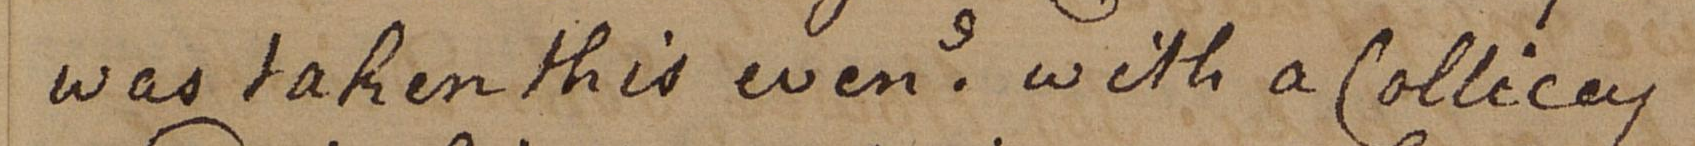was taken this even^g. with a Collicey
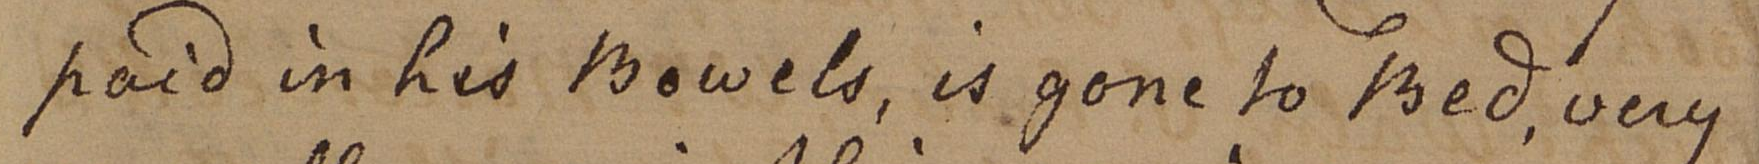paid in his Bowels, is gone to Bed, very
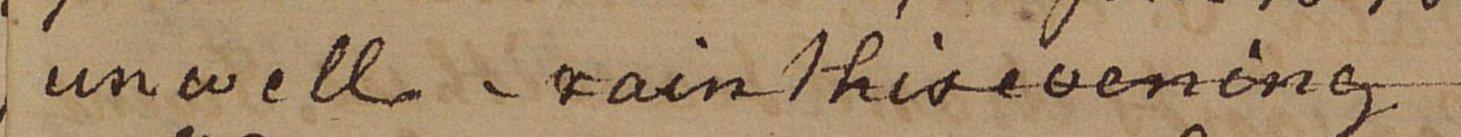unwell- rain this evening
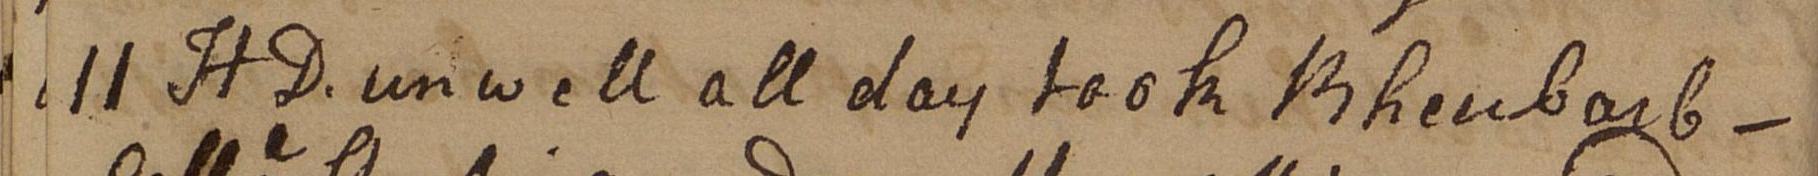11 H D. unwell all day took Rheubarb-
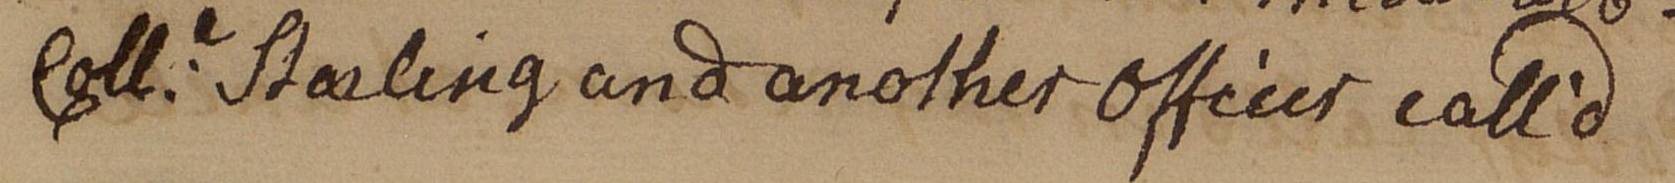Coll^l. Starling and another Officer call'd
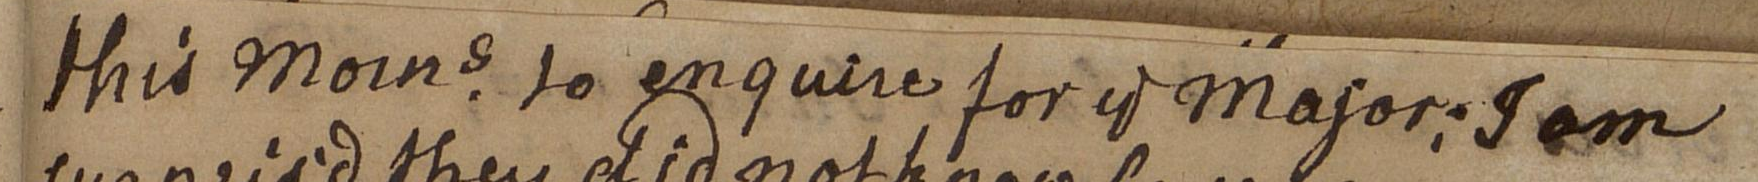this Morn^g. to enquire for y^e Major; I am
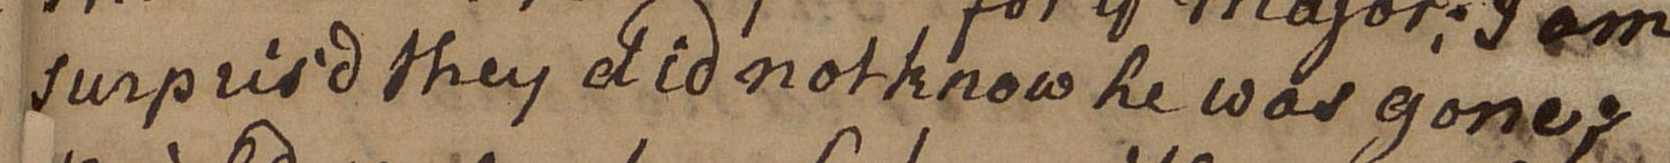surpris'd they did not know he was gone,
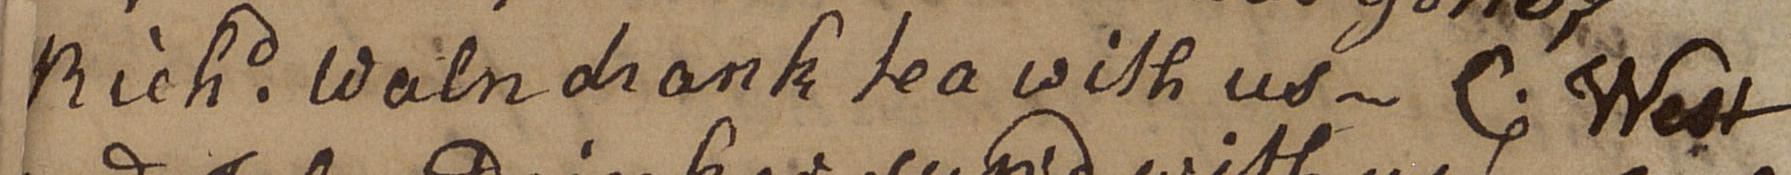Rich^d. Waln drank tea with us- C. West
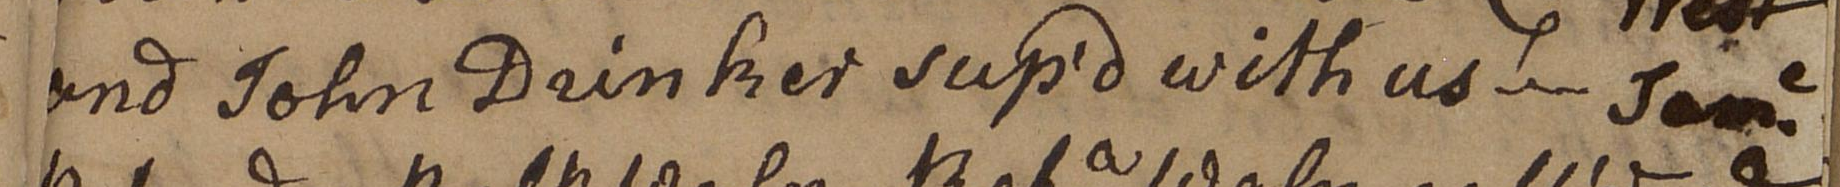and John Drinker sup'd with us- Jan^e.
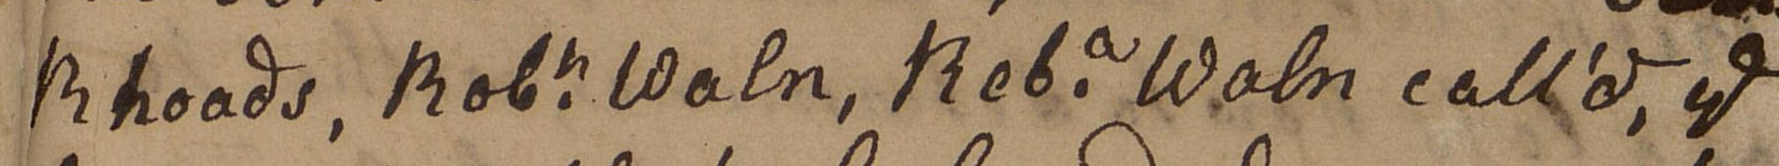Rhoads, Rob^t. Waln, Reb^a. Waln call'd, y^e
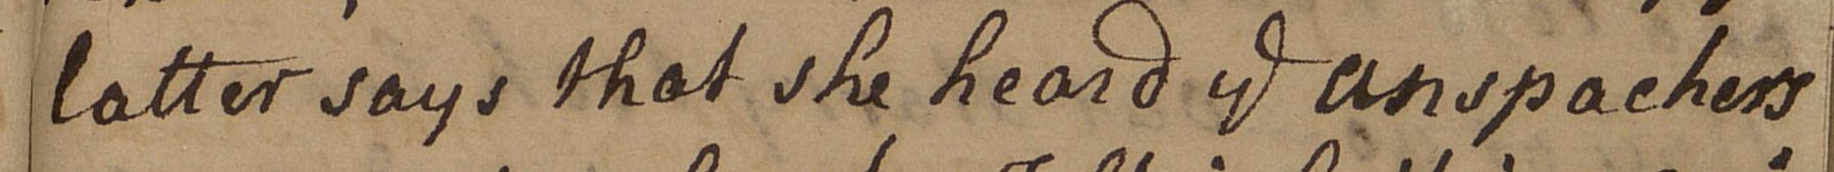latter says that she heard y^e Anspachers
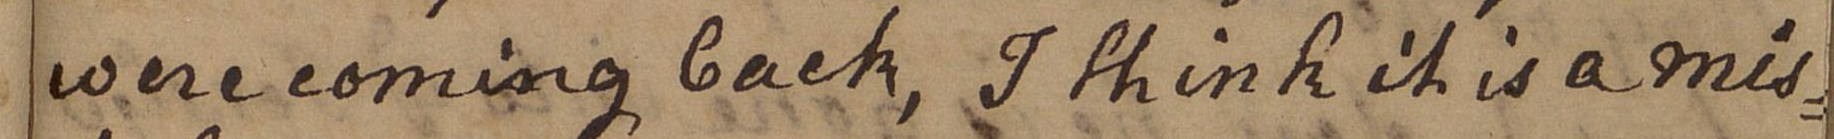were coming back, I think it is a mis-
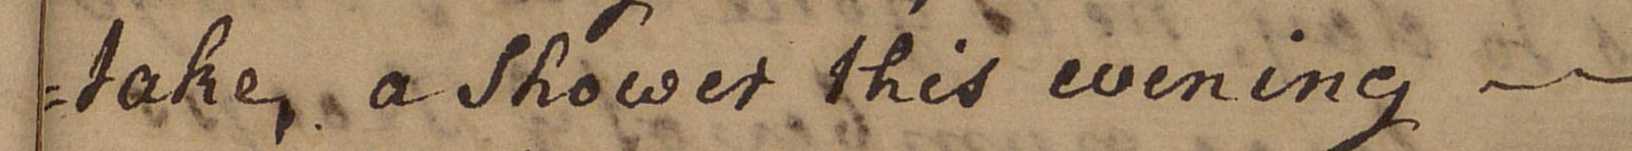-take, a shower this evening-
